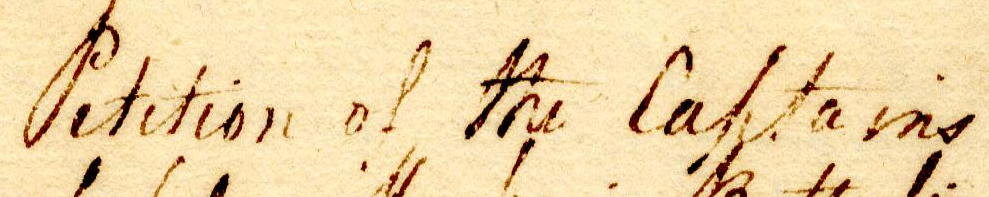Petition of the Captains
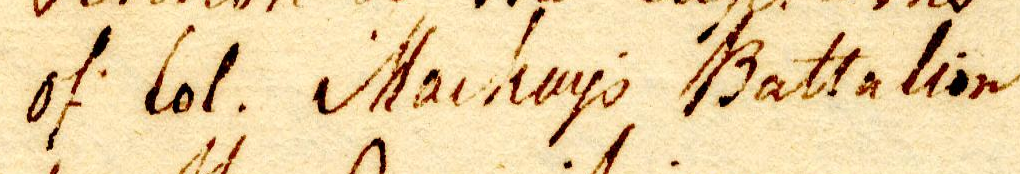of Col. Mackay's Battalion
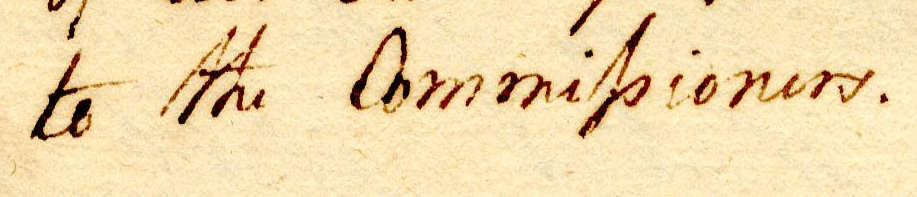to the Commissioners.
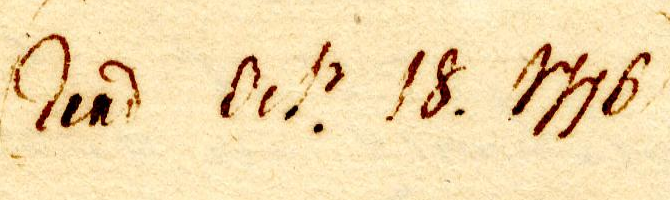(read Oct^r. 18. 1776)
